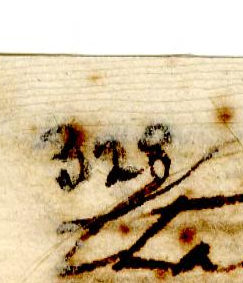328
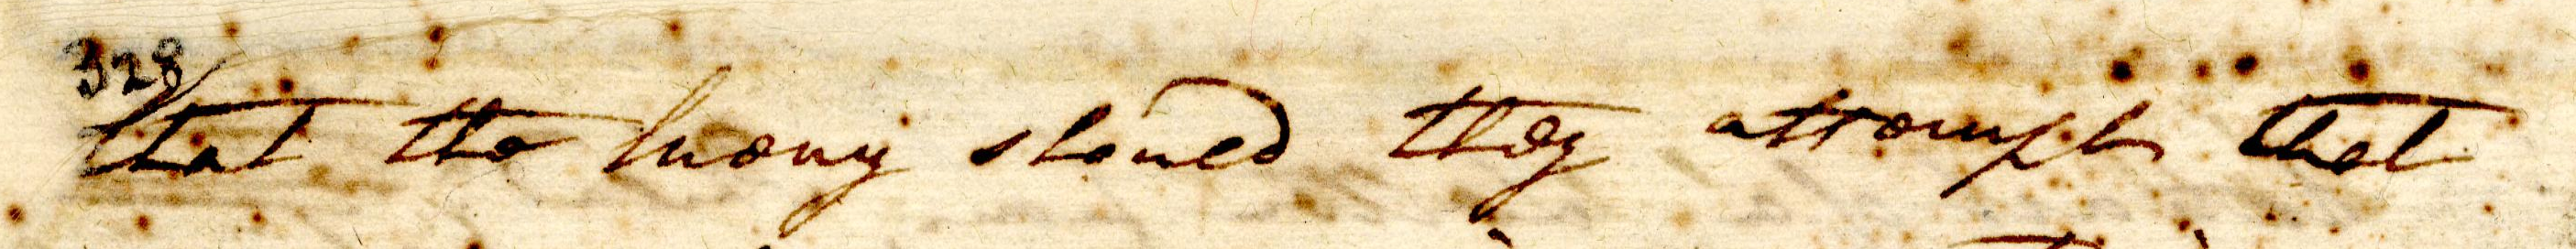That the army should they attempt that
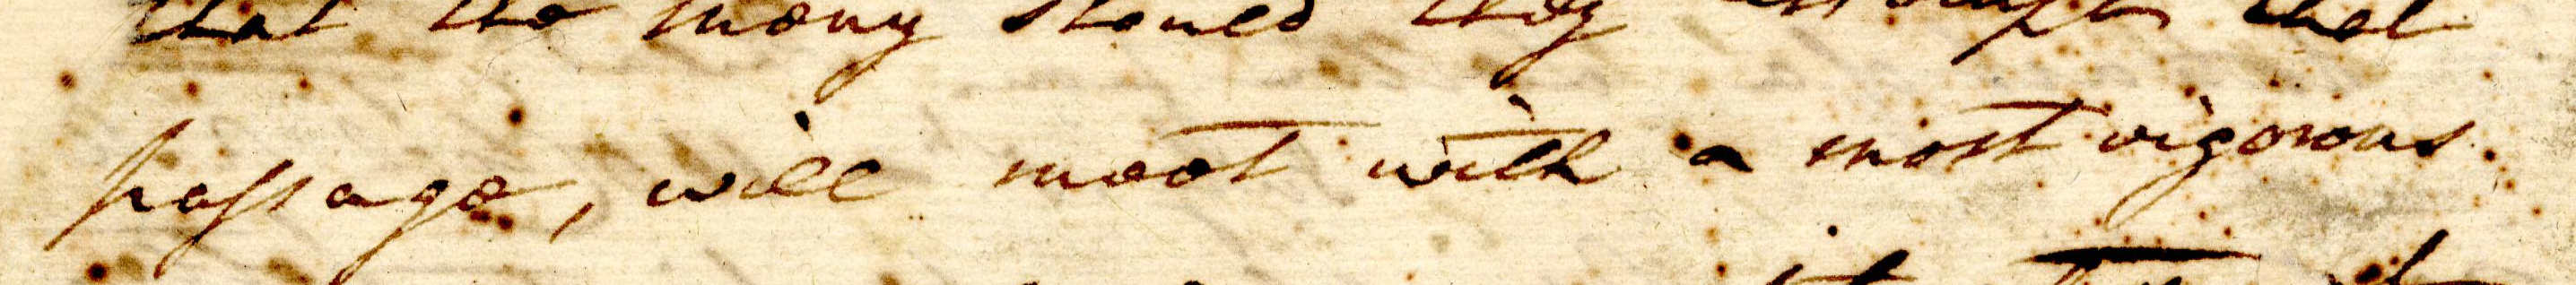passage, will meet with a most vigorous.
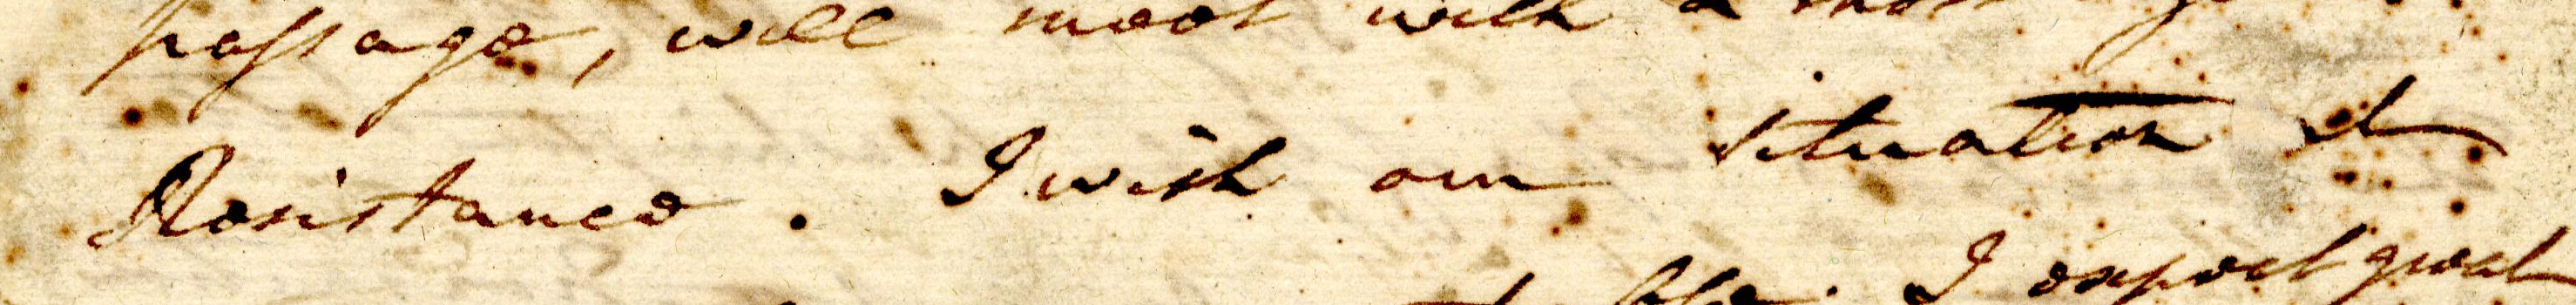Resistance. I wish our Situation
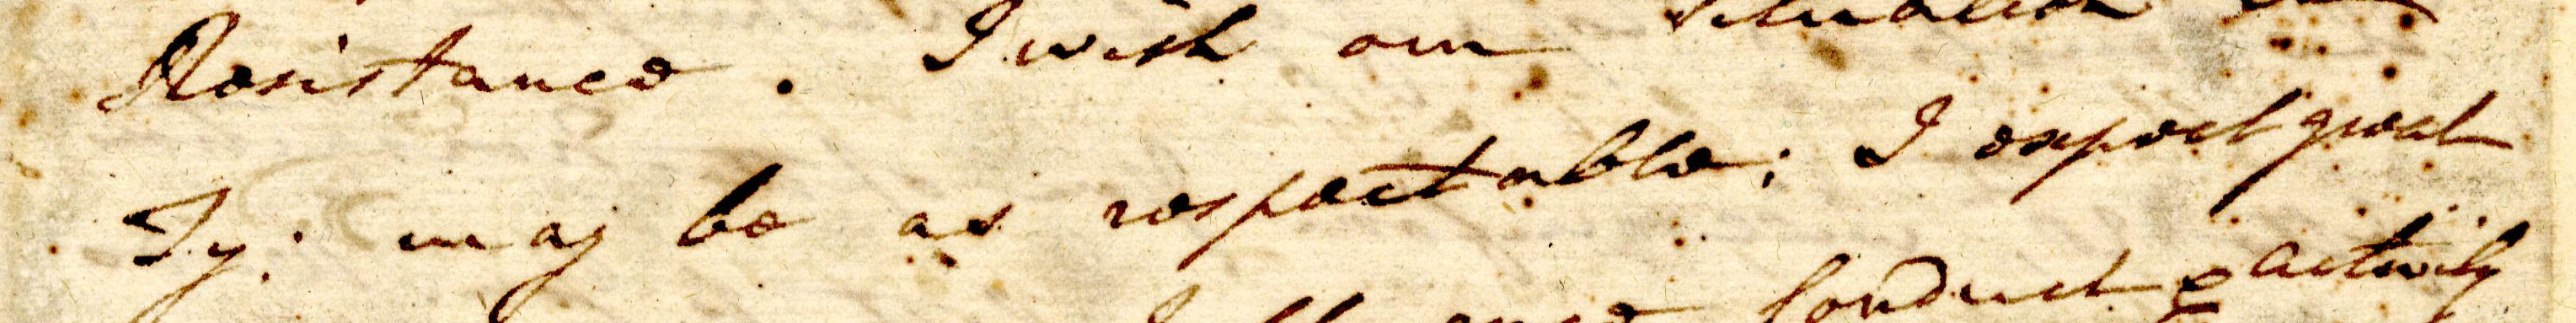Ty: may be as respectable; I expect great
